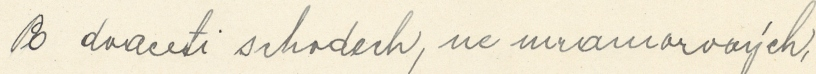Po dvaceti schodech, ne mramorových,
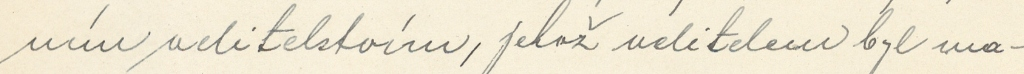ním velitelstvím, jehož velitelem byl ma-
